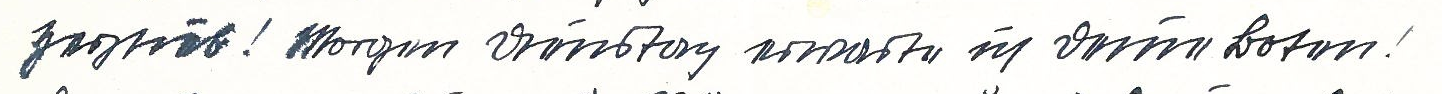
Herzlieb! Morgen Dienstag erwarte ich Deine Boten!
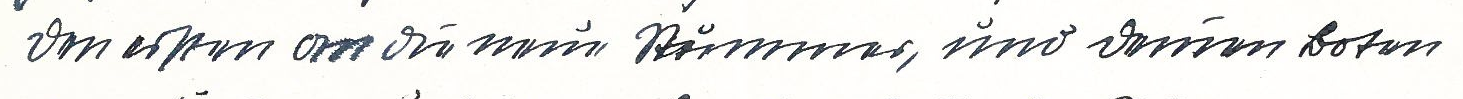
Den ersten an die neue Nummer, und Deinen Boten
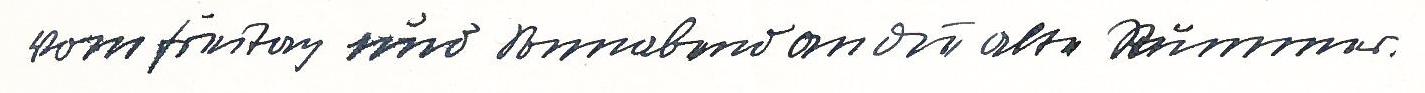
vom Freitag und Sonnabend an die alte Nummer.
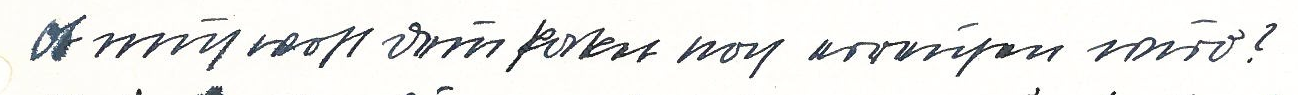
Ob mich nun wohl Dein Paket noch erreichen wird?
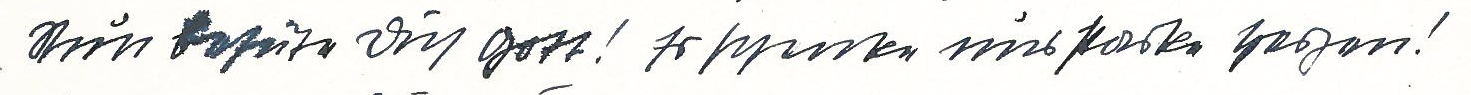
Nun behüte Dich Gott! Er schenke uns starke Herzen!
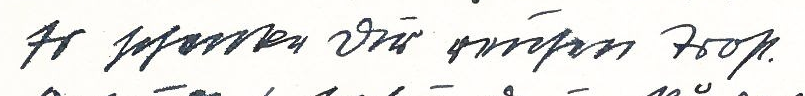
Er schenke uns reichen Trost.
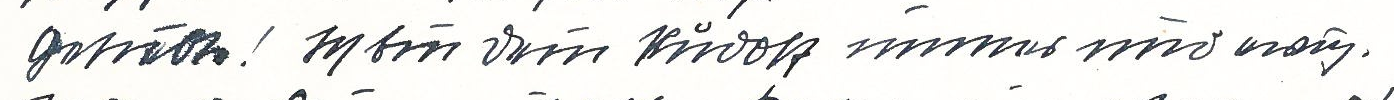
Geliebte! Ich bin Dein immer und ewig.
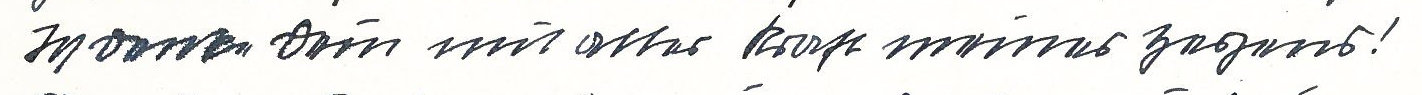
Ich denke Dein mit aller Kraft meines Herzens!
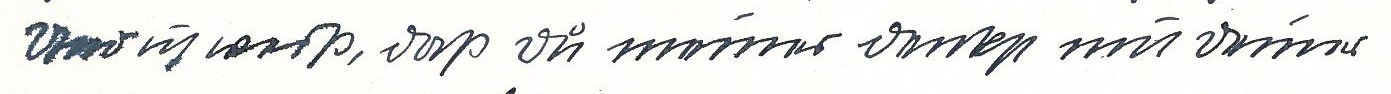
Und ich weiß, daß Du meiner denkst mit Deiner
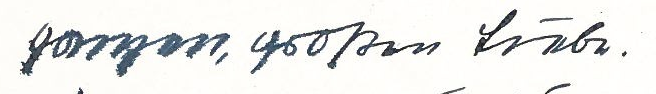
ganzen, großen Liebe.
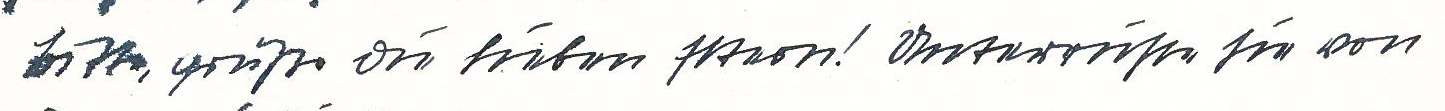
Bitte grüße die lieben Eltern! Unterrichte sie von
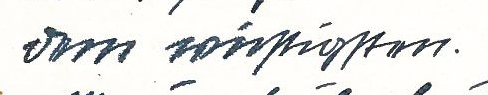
dem wichtigsten.
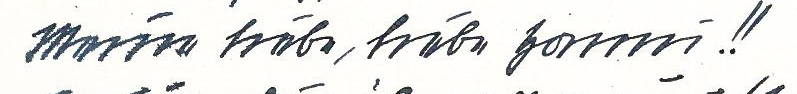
Meine liebe, liebe !!
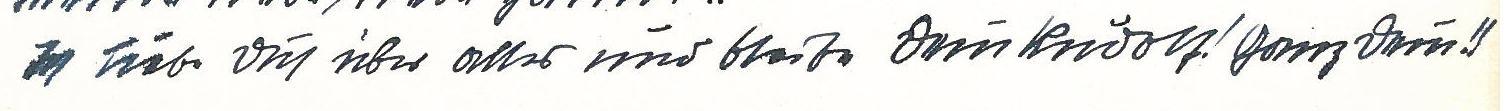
Ich liebe Dich über alles und bleibe Dein ! Ganz Dein!!
